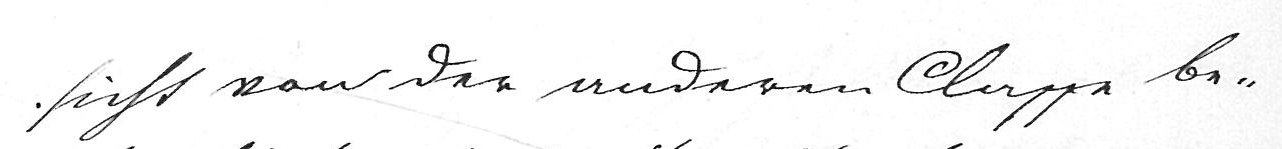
sicht von der anderen Classe be-
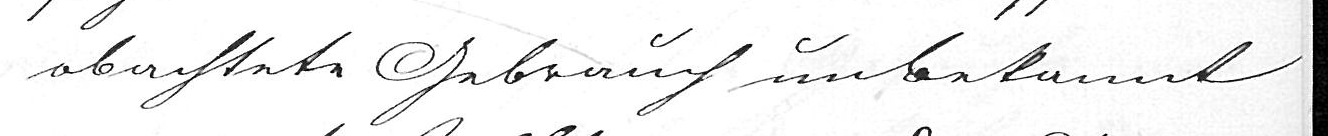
obachtete Gebrauch unbekannt
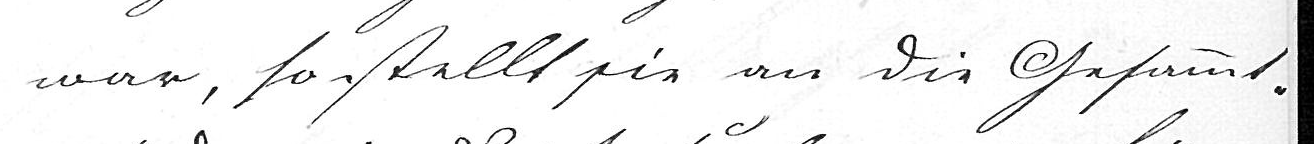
war, so stellt sie an die Gesammt-
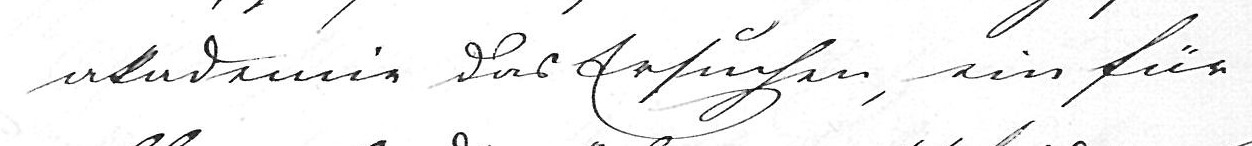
akademie das Ersuchen, ein für
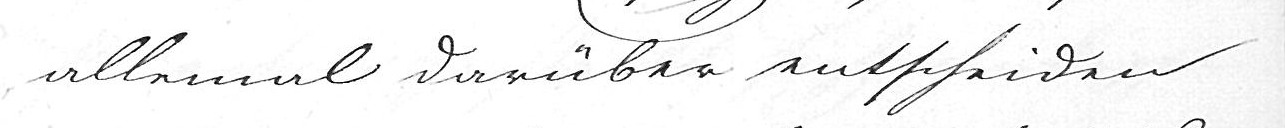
allemal darüber entscheiden
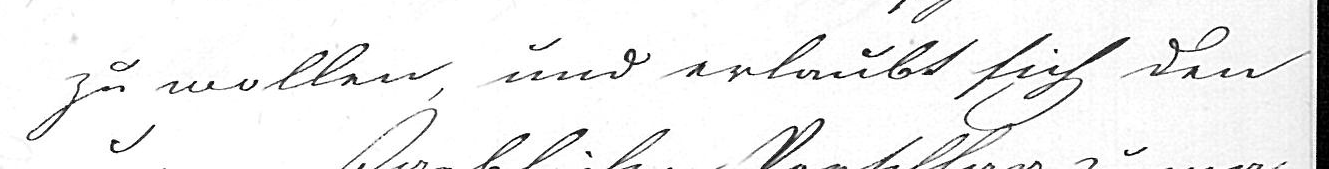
zu wollen, und erlaubt sich den
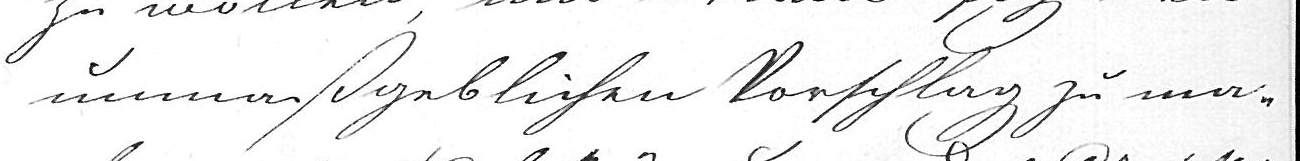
unmaßgeblichen Vorschlag zu ma-
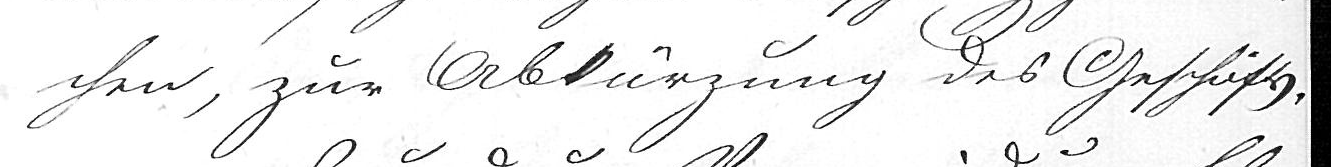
chen, zur Abkürzung des Geschäfts-
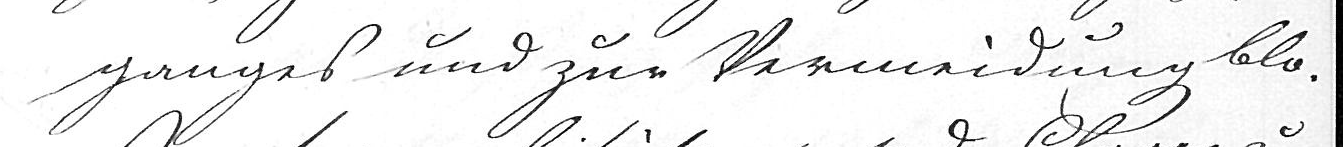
ganges und zur Vermeidung blo-
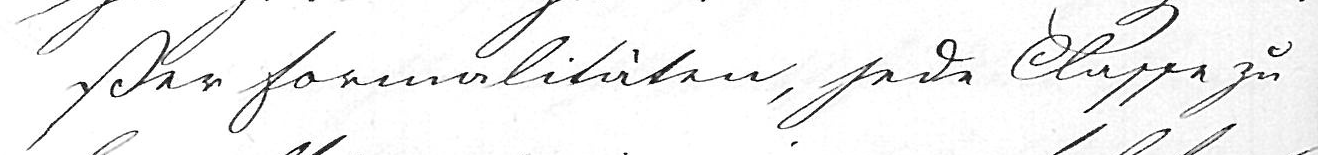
ßer Formalitäten, jede Classe zu
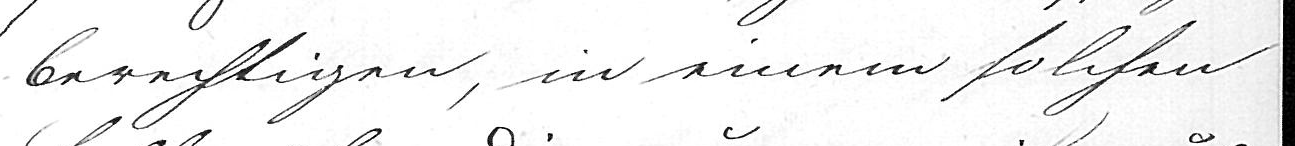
berechtigen, in einem solchen
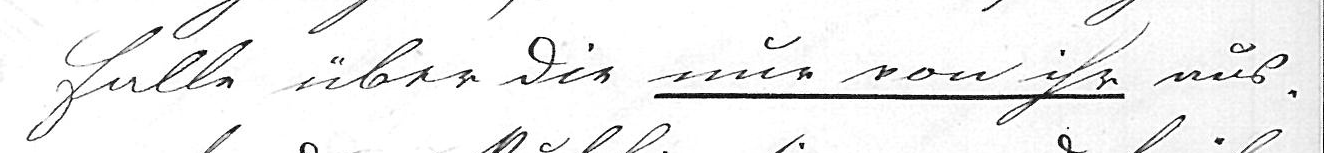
Falle über die nur von ihr aus-
